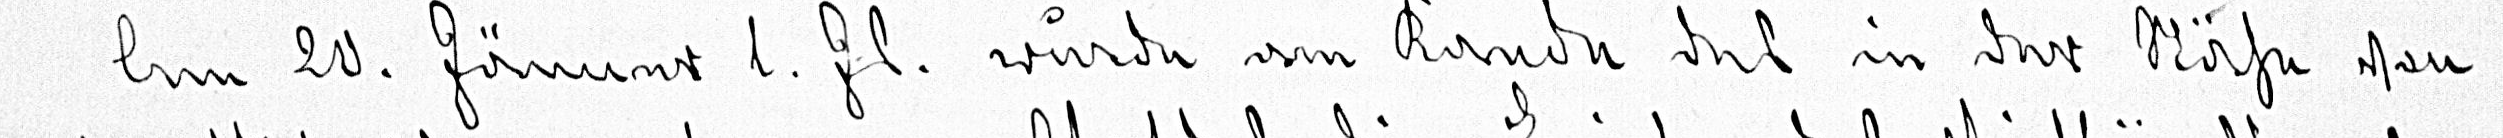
Am 20. Jänner 1. Fs. wurde von Rande des in der Nähe von
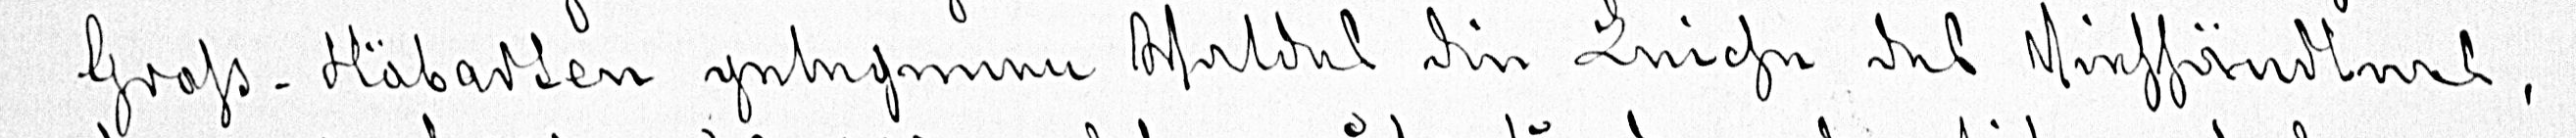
Gross - Häbarten gelegenen Waldes die Leiche des Viehhändlers,
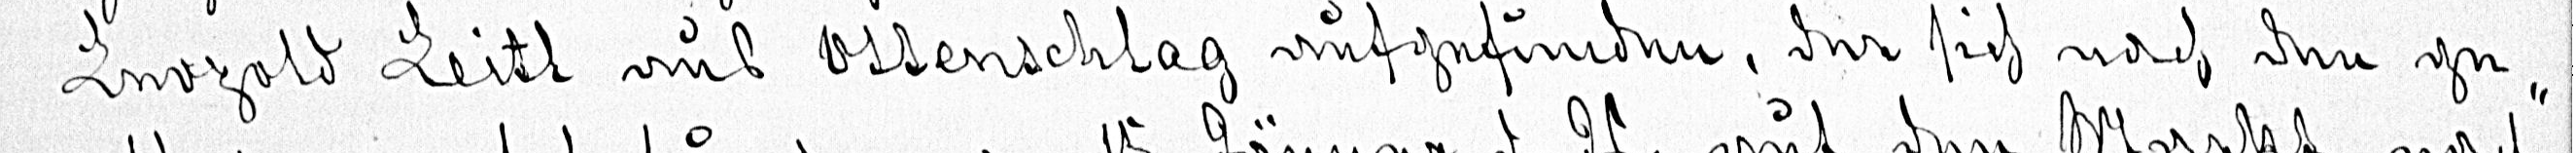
Leopold Leitl aus Ottenschlag aufgefunden, der sich nach den ge¬
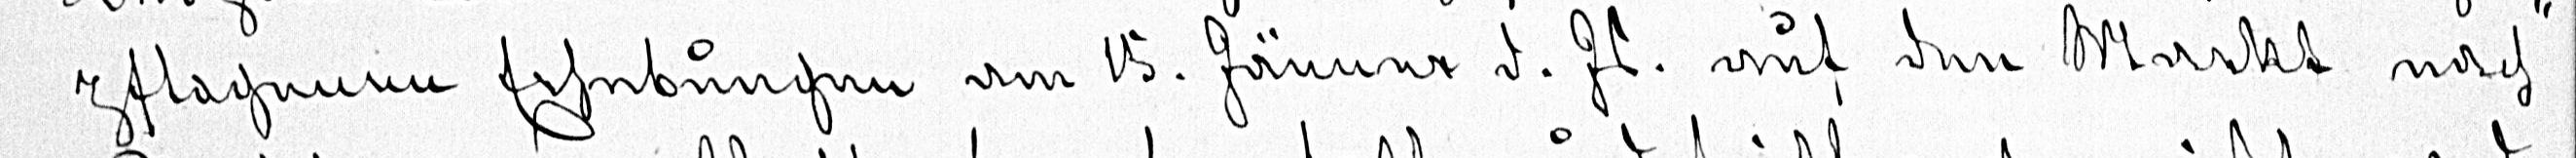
pflogenen Erhebungen am 15. Jänner d. Js. auf den Markt nach
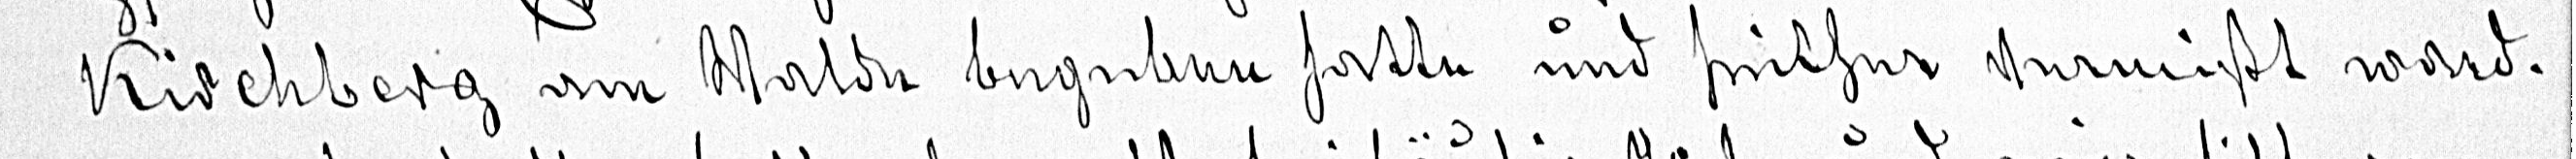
Kirchberg am Walde begeben hatte und heicher vermißt ward.
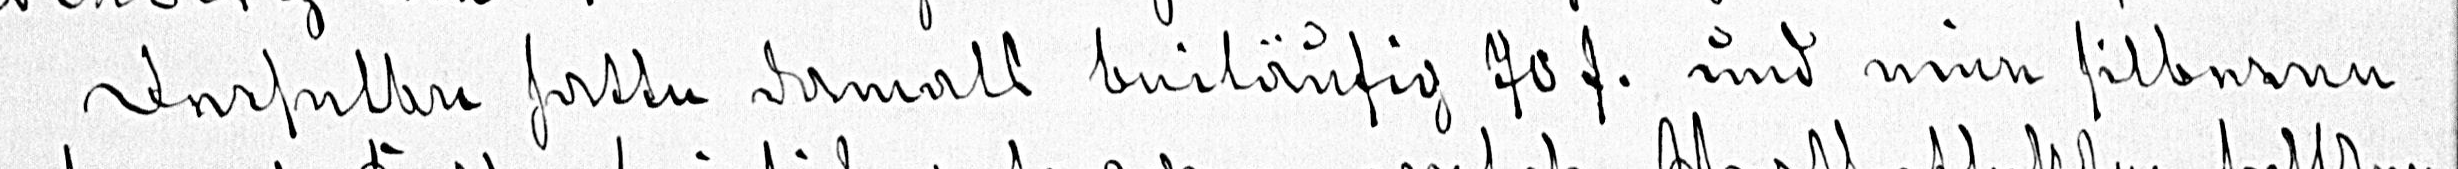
Derselbe hatte damals beiläufig 70 f. und eine silberne
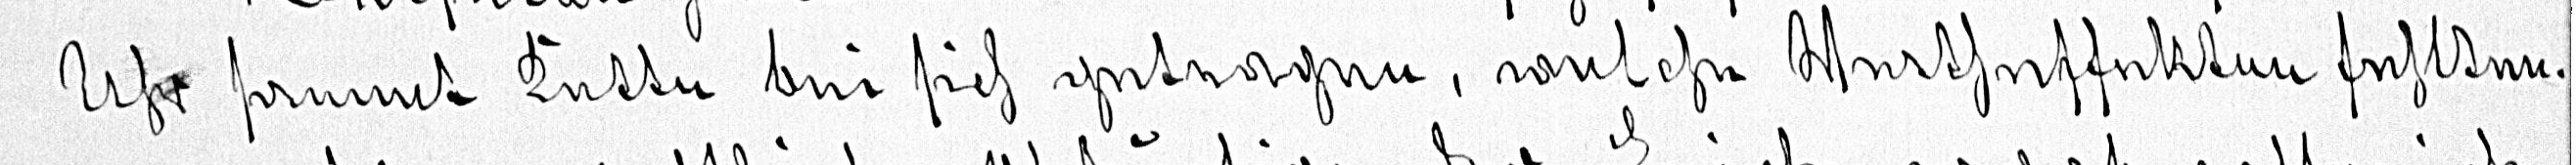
Uhr sammt Kette bei sich getragen, welche Wertheffekten fehlten.
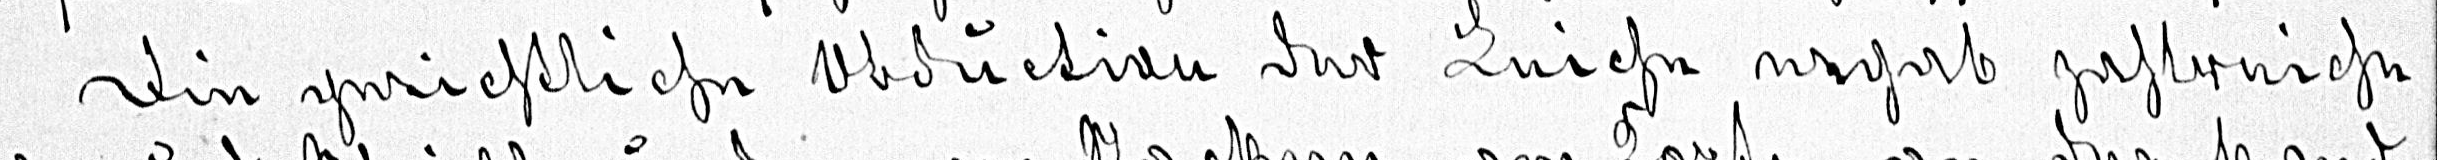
Die gerichtliche Obduction der Leiche ergab zahlreiche
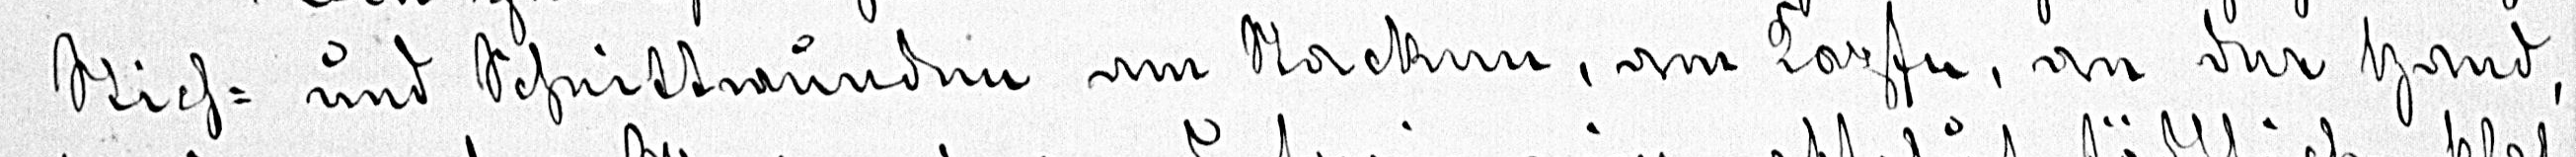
Stich= und Schnittwunden am Nacken, am Kopfe, an der Hand,
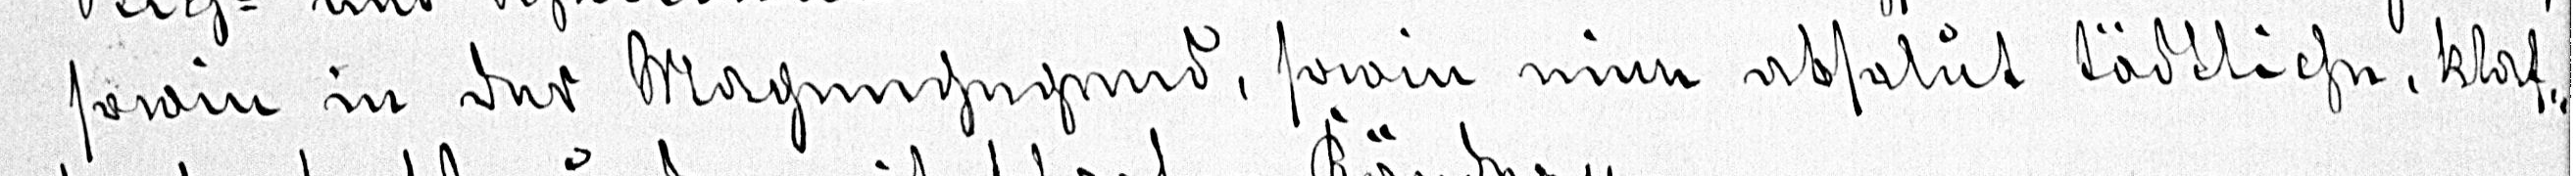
sowie in der Magengegend, sowie eine absolut tödtliche, klaf¬
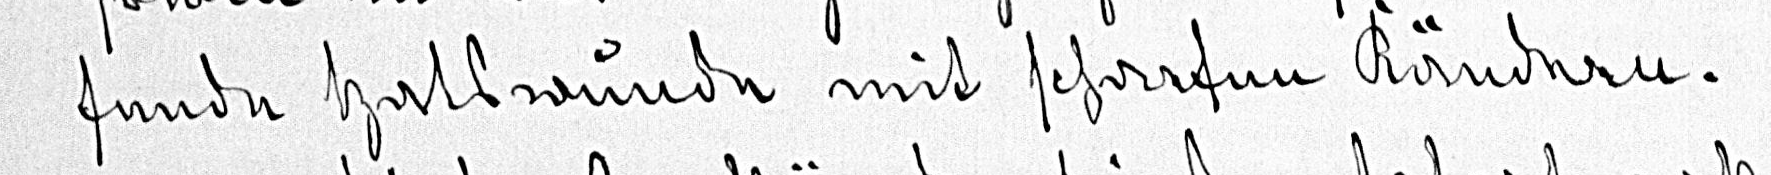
fende Halswunde mit scharfen Rändern.
